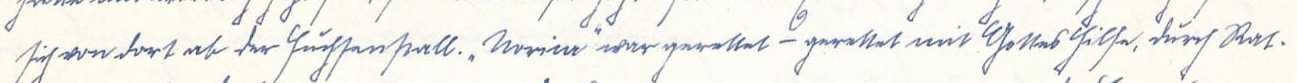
sich von dort ab der Fuchsenstall. „Norica“ war gerettet – gerettet mit Gottes Hilfe, durch Rat
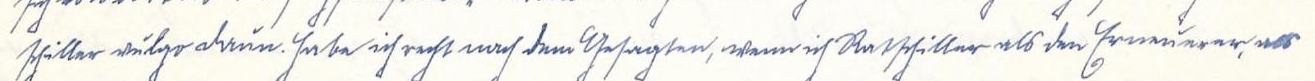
schiller v/o Daun. Habe ich recht nach dem Gesagten, wenn ich Ratschiller als den Erneuerer, als
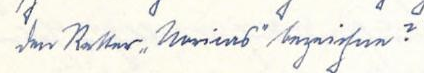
den Retter „Noricas“ bezeichne?
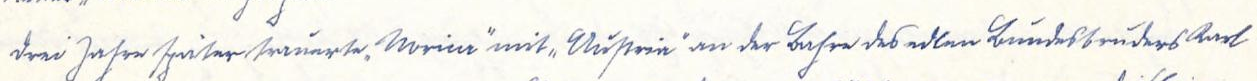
Drei Jahre später trauerte „Norica“ mit „Austria“ an der Bahre des edlen Bundesbruders Karl
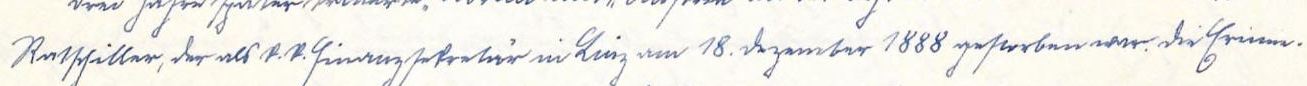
Ratschiller, der als k. k. Finanz Sekretär in Linz am 18. Dezember 1888 gestorben war. Die Erinne-
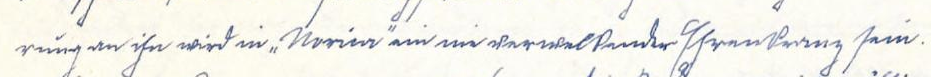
rung an ihn wird in „Norica“ ein nie verwelkender Ehrenkranz sein.
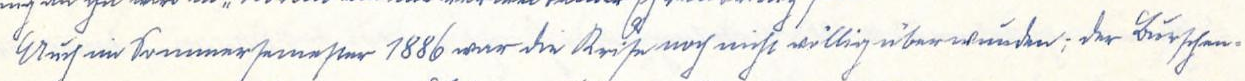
Auch im Sommersemester 1886 waren die Krise noch nicht völlig überwunden. Der Burschen-
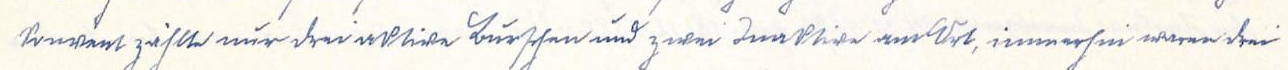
konvent zählte nur drei aktive Burschen und zwei Inaktive am Ort, immerhin waren drei
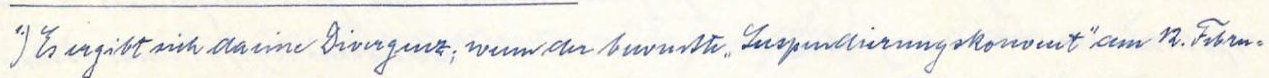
1) Es ergibt sich da eine Divergenz, wenn der erwähnte „Suspendierungskonvent“ am 12. Febru-
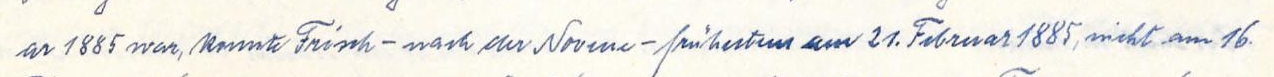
ar 1885 war, konnte Frisch - nach der Novene - frühestens am 21. Februar 1885 nicht am 16.
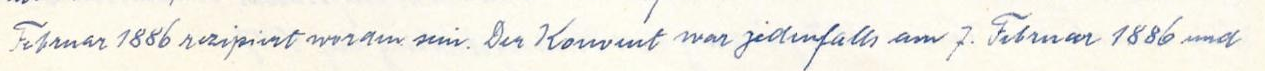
Februar 1886 rezipiert worden sein. Der Konvent war jedenfalls am 7. Februar 1886 und
